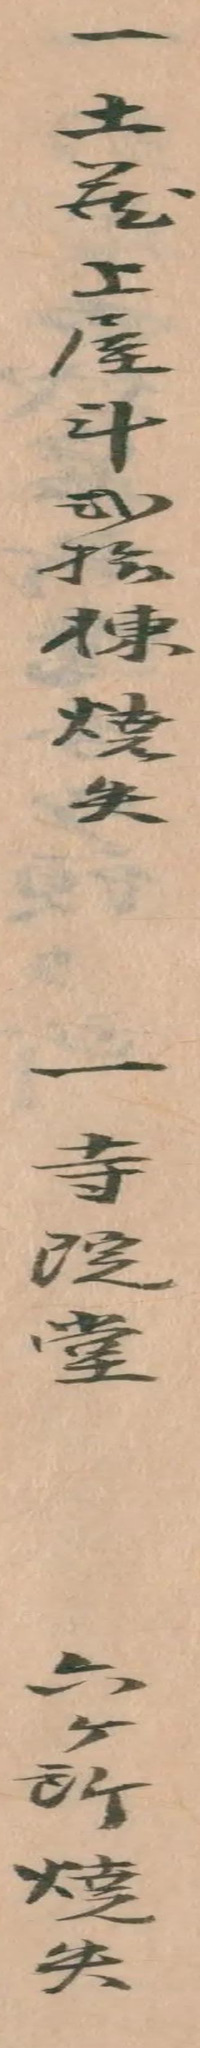一土蔵上屋斗弐拾棟焼失一寺院堂六ヶ所焼失
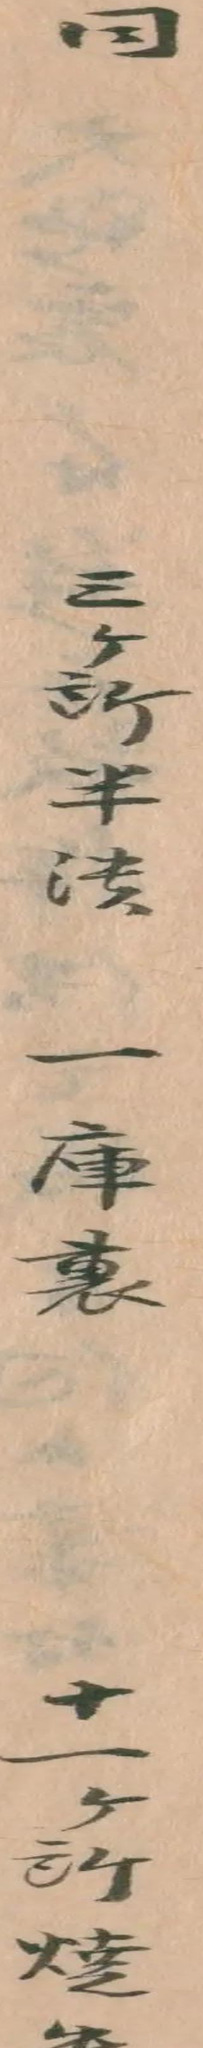一同三ヶ所半潰一庫裏十一ヶ所焼失
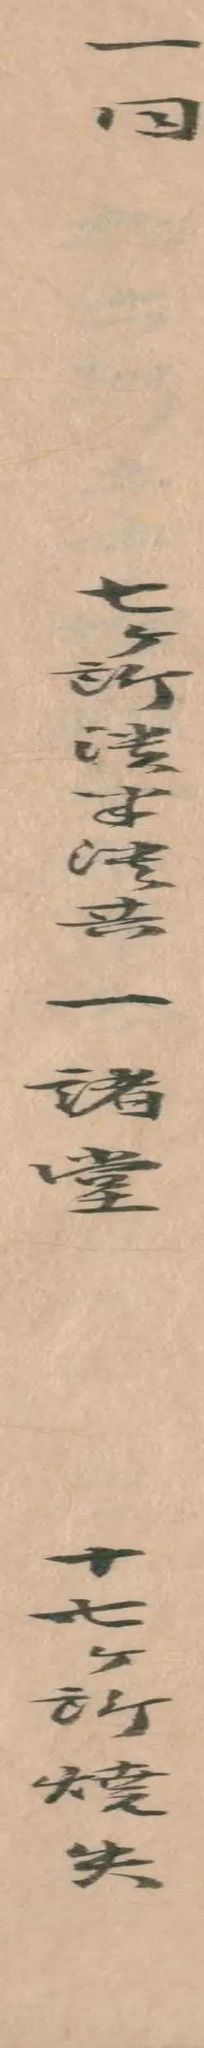一同七ヶ所潰半潰共一諸堂十七ヶ所焼失
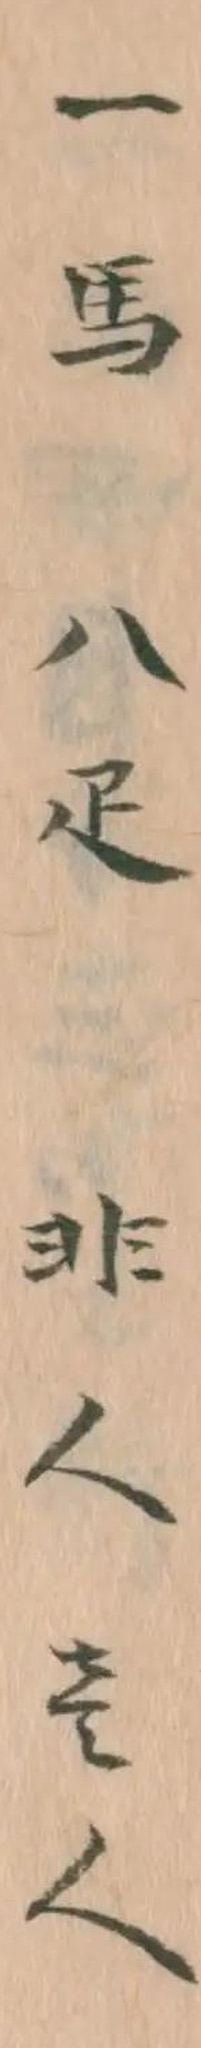一馬八疋非人壱人
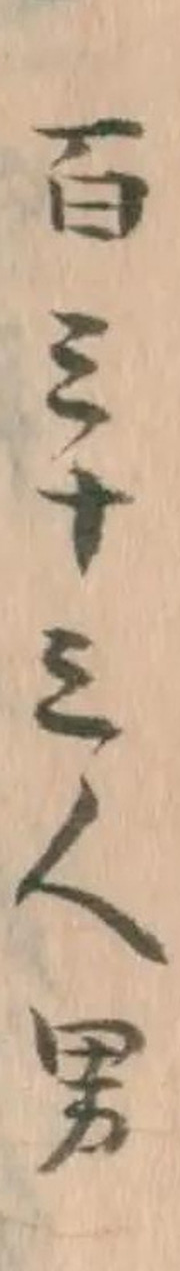内百三十三人男
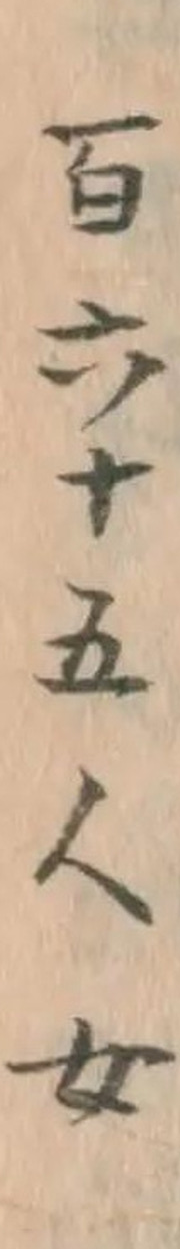百六十五人女

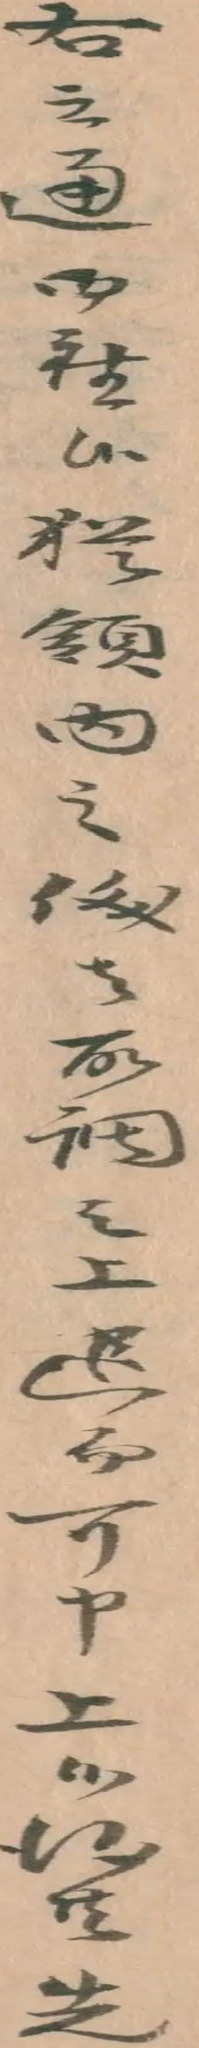右之通御座候猶領内之儀ハ取調之上追而可申上候得共先
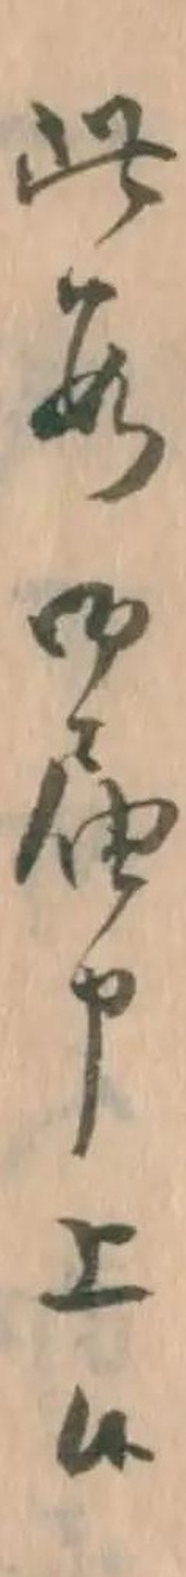此段御届申上候
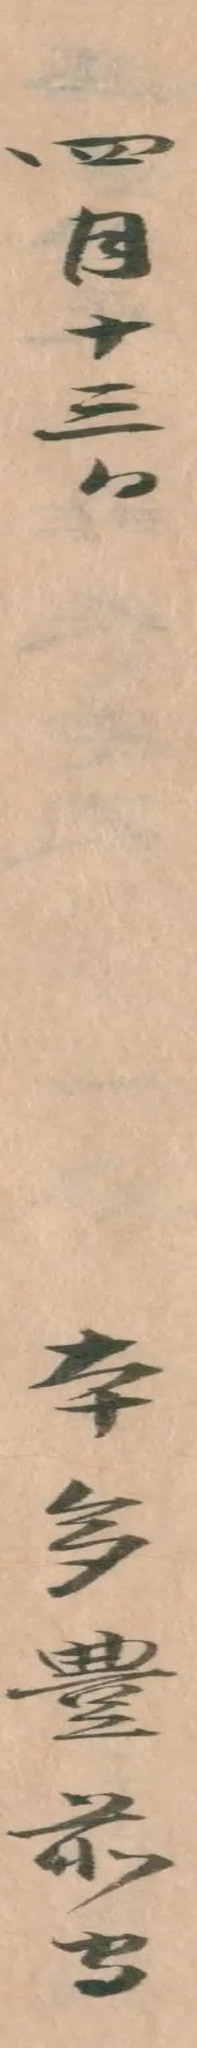四月十三日本多豊後守
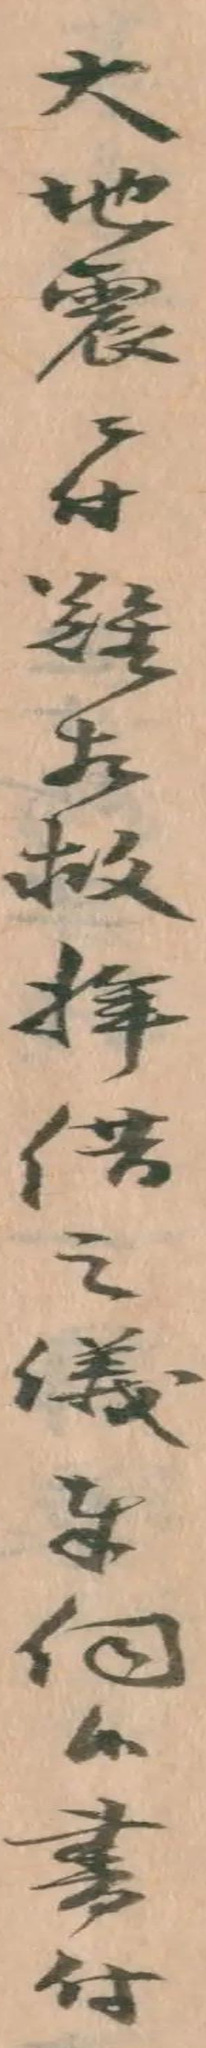大地震二付難相救拝借之儀奉伺候書付
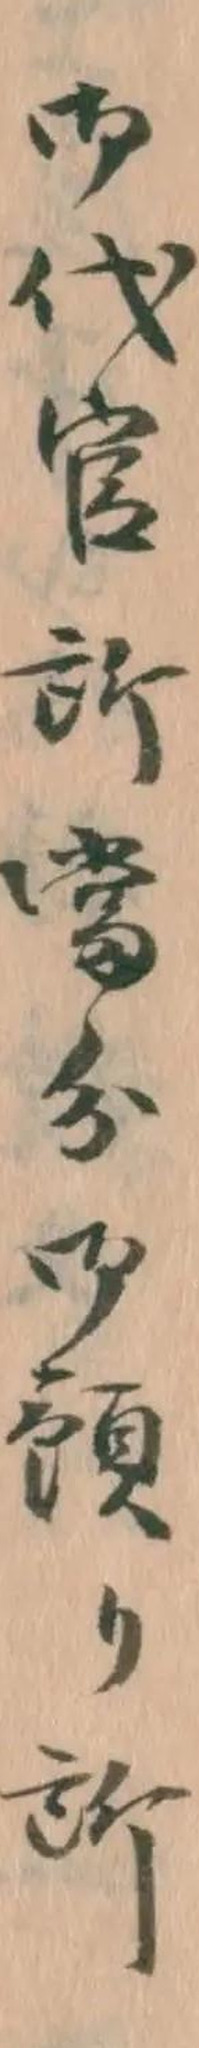御代官所当分御預り所
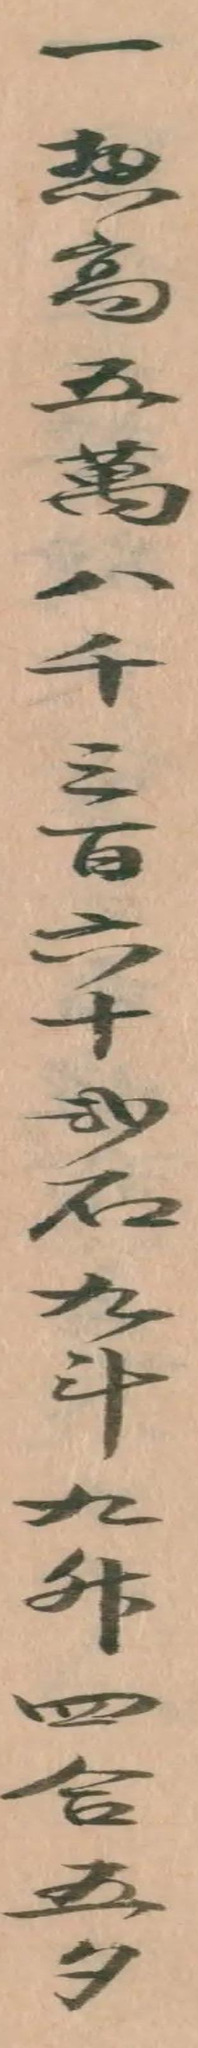一惣高五万八千三百六十弐石九斗九升四合五勺
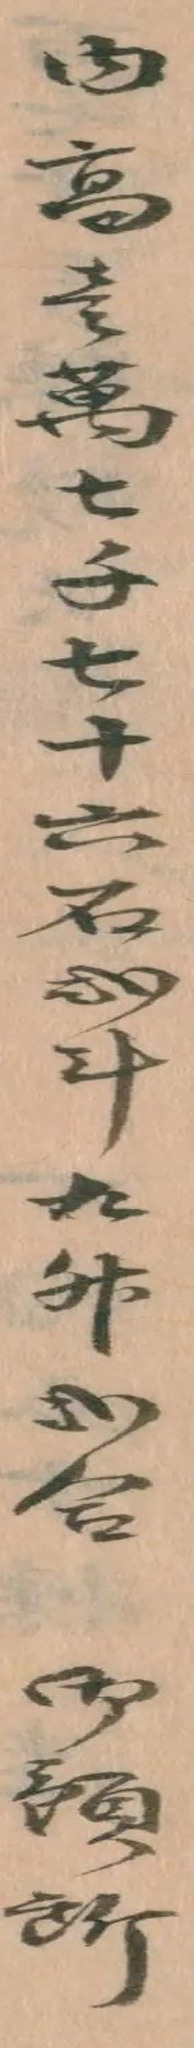内高壱万七千七十六石弐斗九升弐合御預所
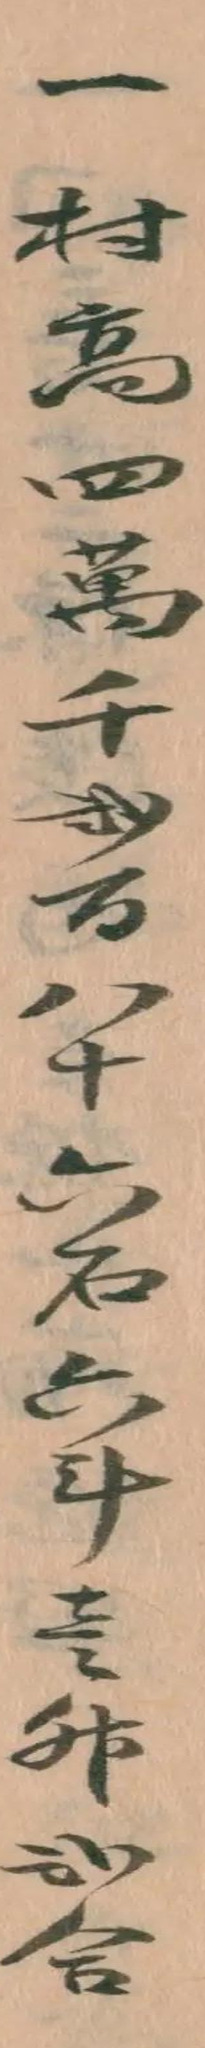一村高四万千弐百八十六石六斗壱升弐合
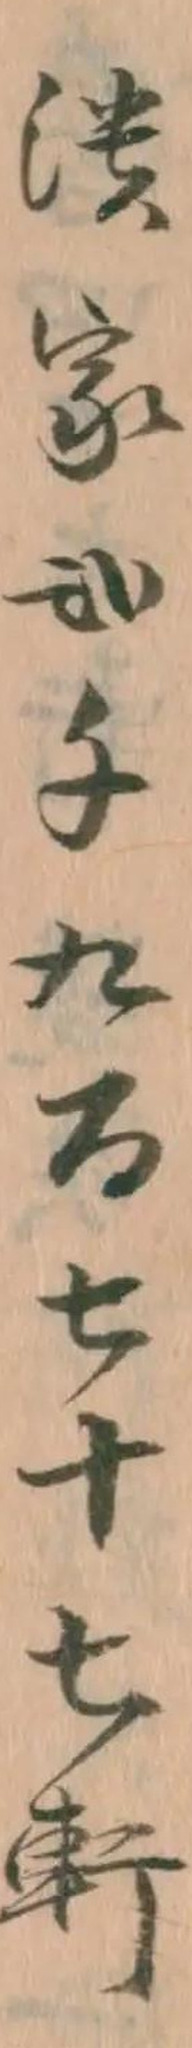潰家弐千九百七十七軒
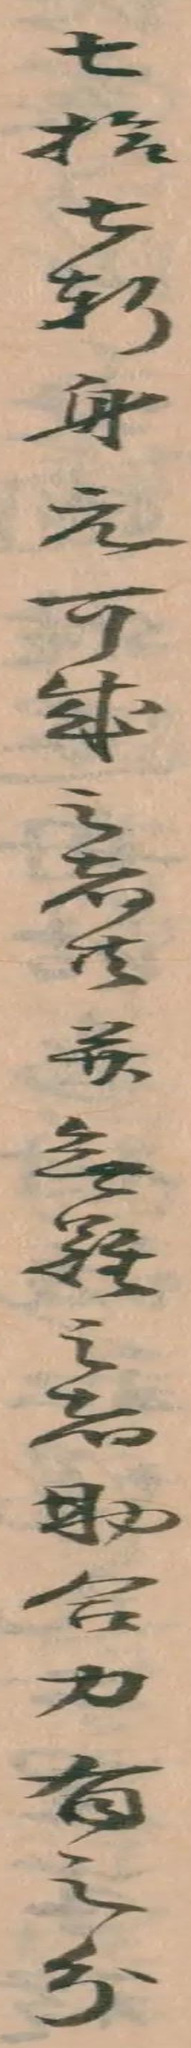七拾七軒身元可成之者共并無難之者助合ヵ有之分
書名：地災撮要. 巻3(地震之部)-巻4(噴火之部)
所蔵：国立国会図書館 National Diet Library, JAPAN
